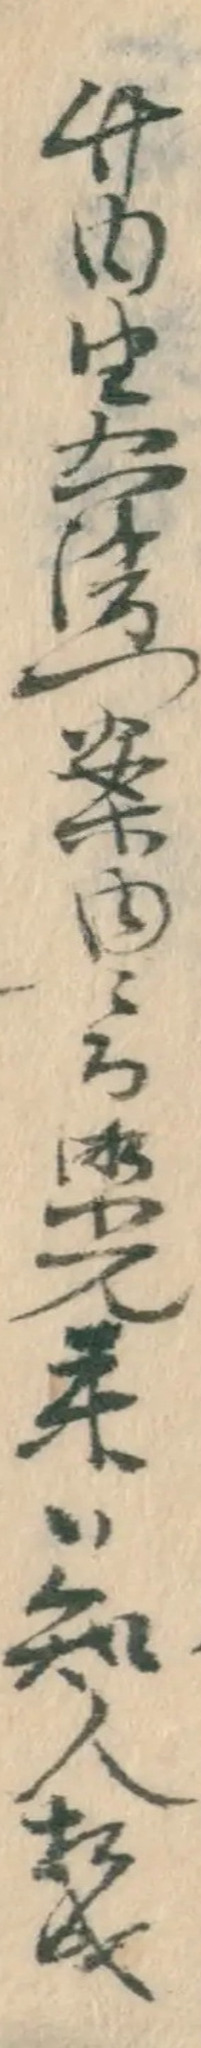竹内由右衛門案内ニ而御光来御知人相成
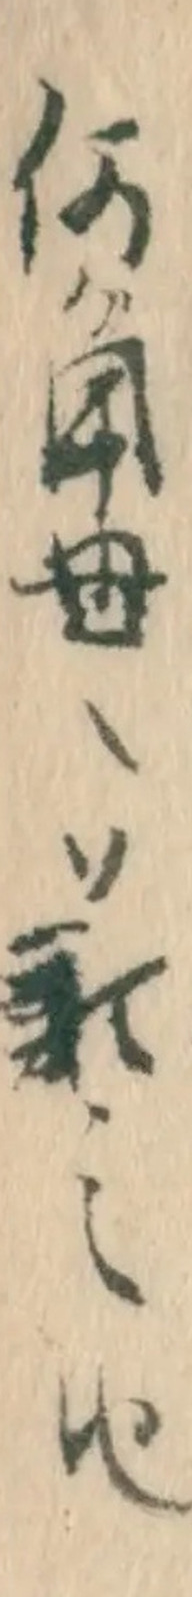何か用母へ御頼之由

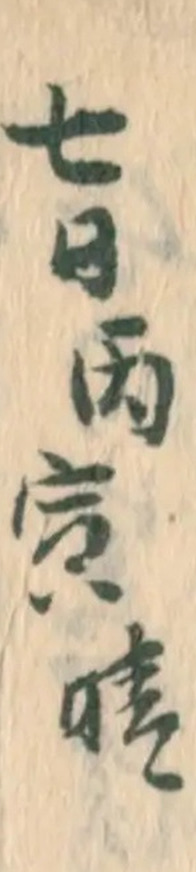七日丙寅晴
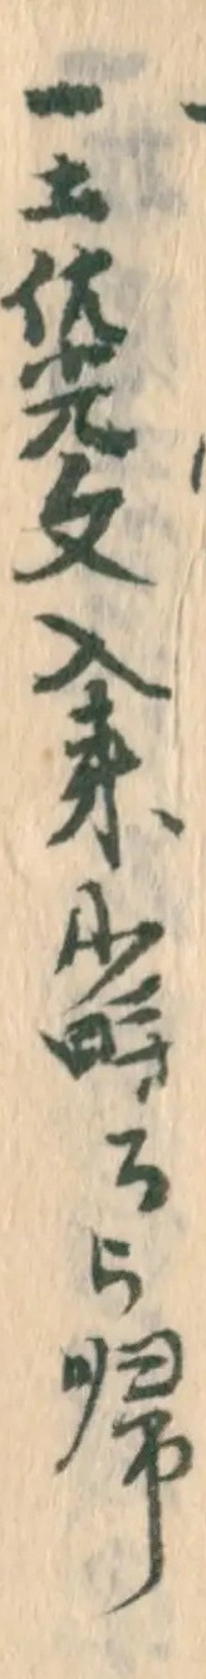一土佐光文入来少時而被帰
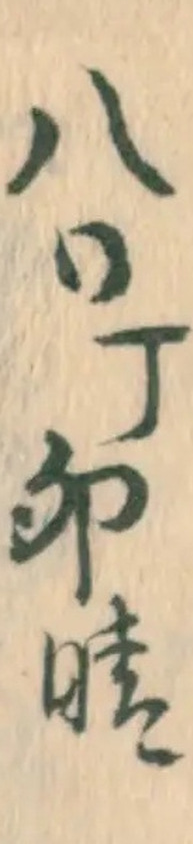八日丁卯晴
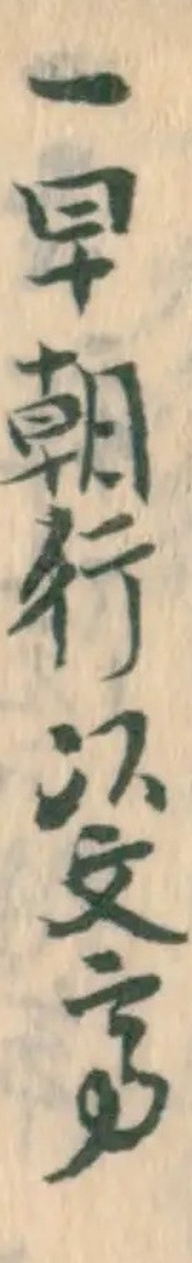一早朝行以文亭
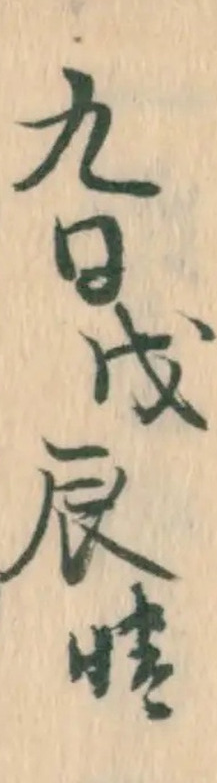九日戊辰晴
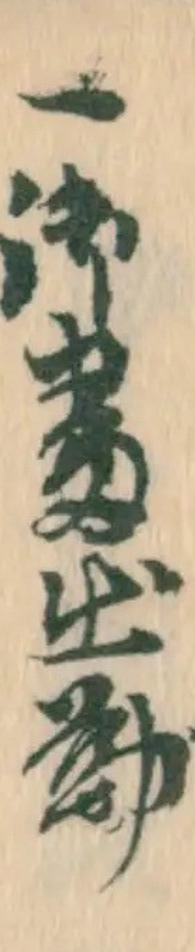一御番出勤
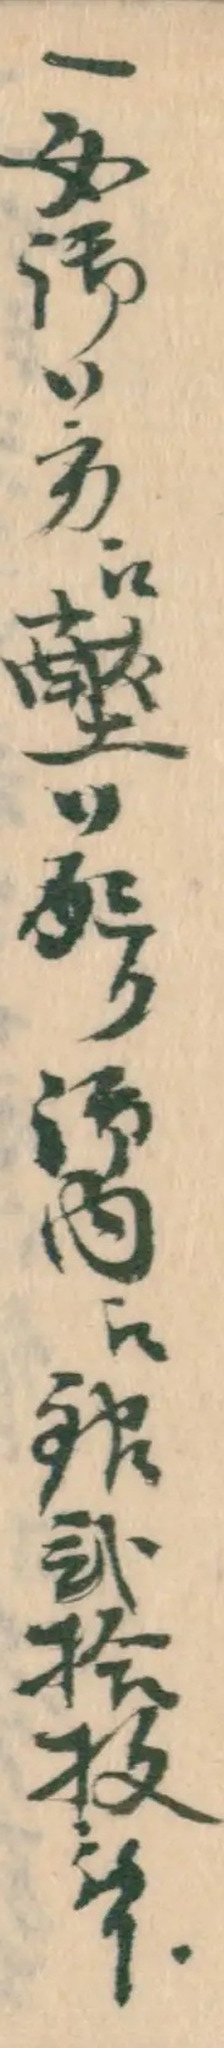一女御御方え献上御配り御内え銀弐拾枚被下
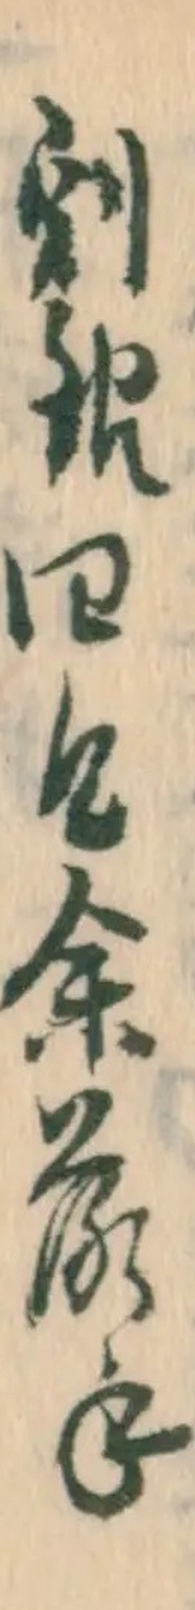割銀四匁余落手
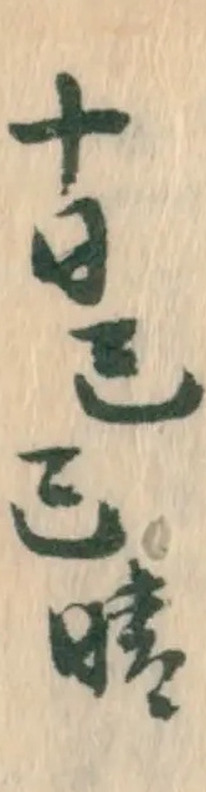十日己巳晴
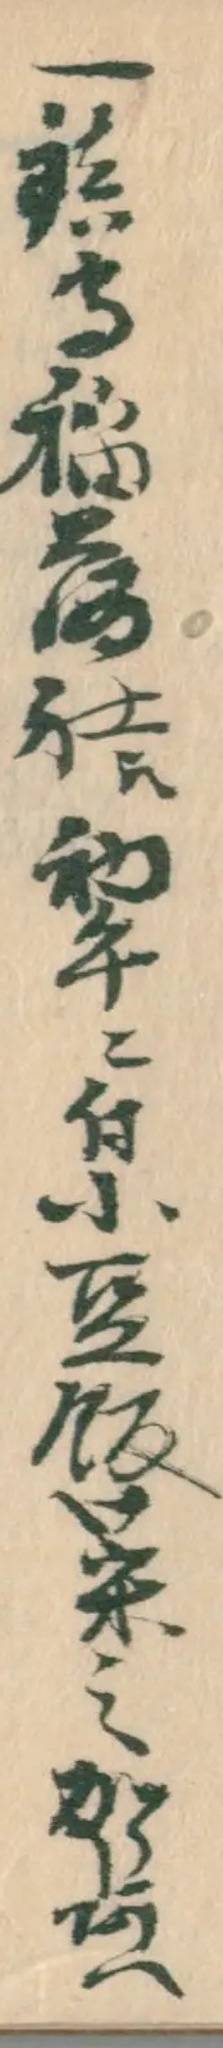一鎮守稲荷社え初午ニ付小豆飯菜之からしあへ
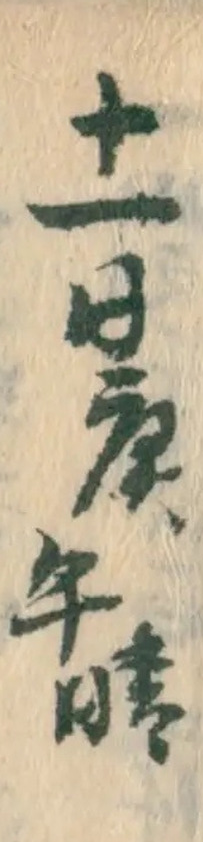十一日庚午晴

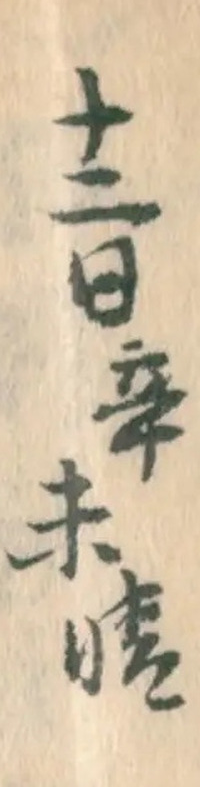十二日辛未晴
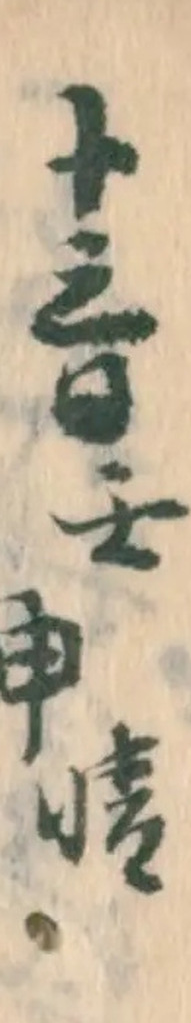十三日壬申晴
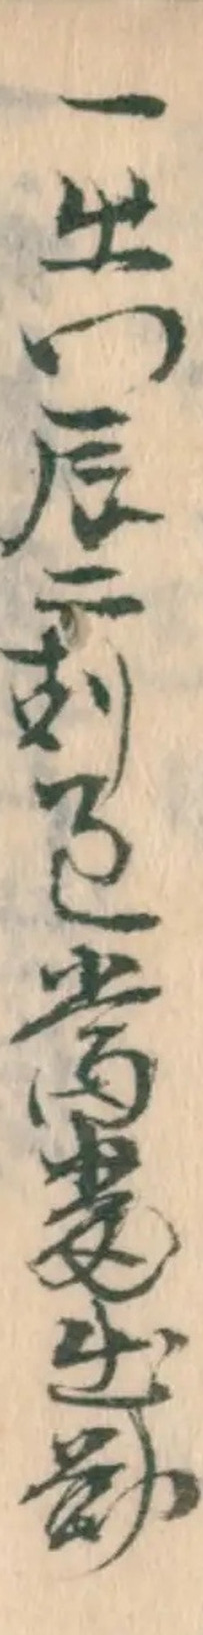一出門辰二刻過当番出勤
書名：禁裏御所御用日記. [131]
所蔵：国立国会図書館 National Diet Library, JAPAN
